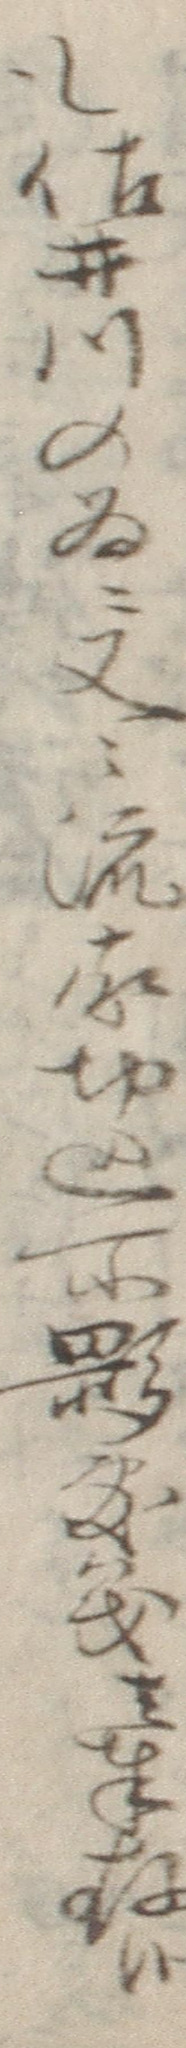も佐井川の為ニ又々流家切込所夥敷義は奉存候
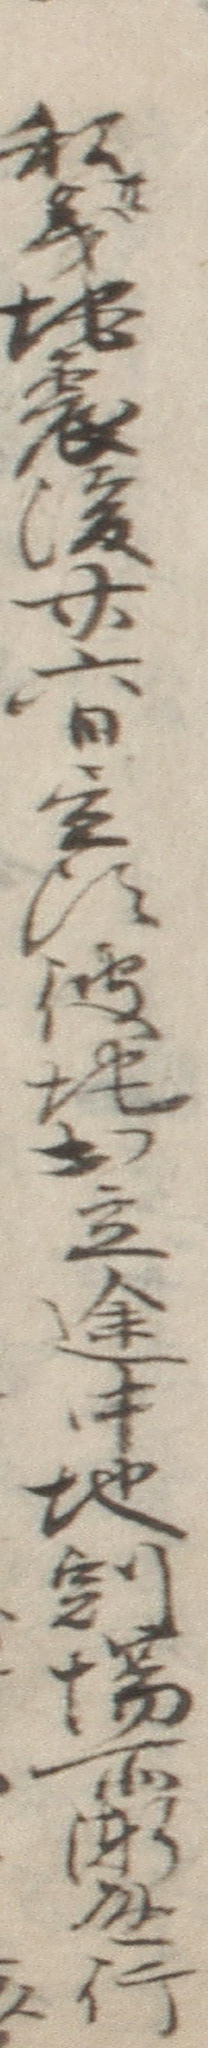一私共義地震後廿六日昼頃彼地出立途中地割場所漸通行
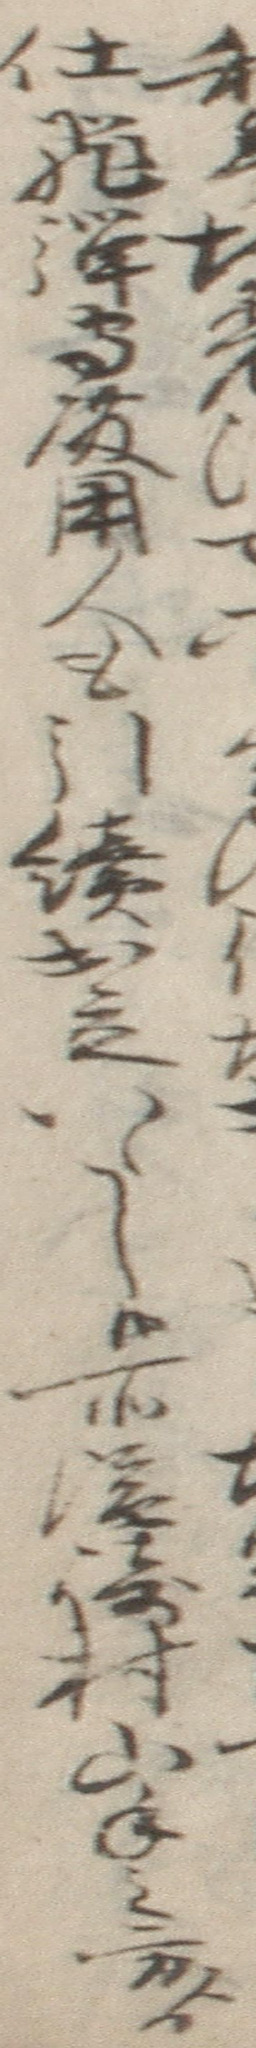仕飛騨守殿用人も引続出立いたし候所塩崎村山手之方ゟ

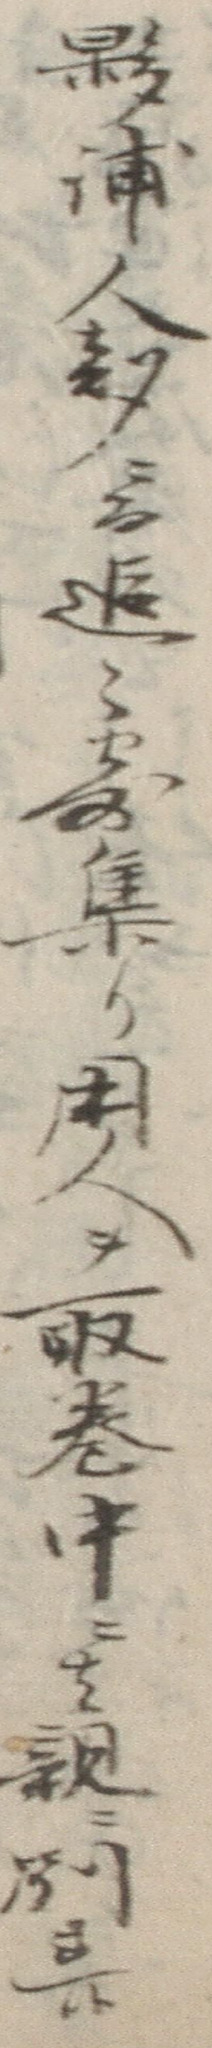夥鋪人声ニ而追々寄集り用人ヲ取巻中ニは親ニ別れ候
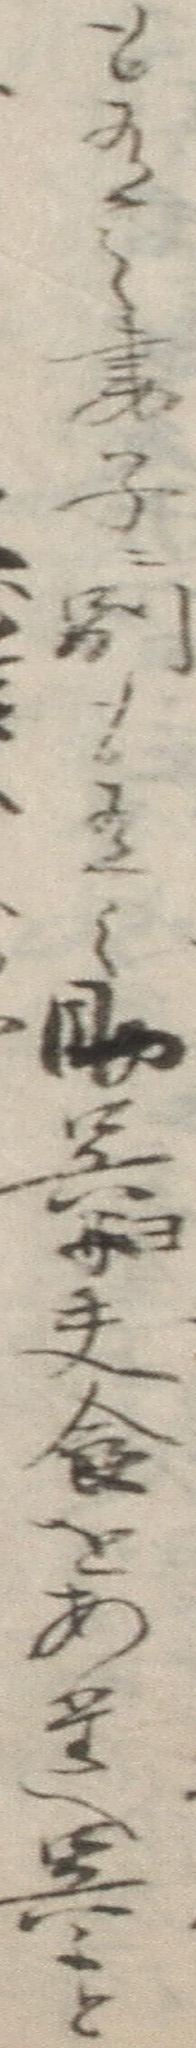も有之妻子ニ別も有之助呉ヨ夫食をあたへ呉よと
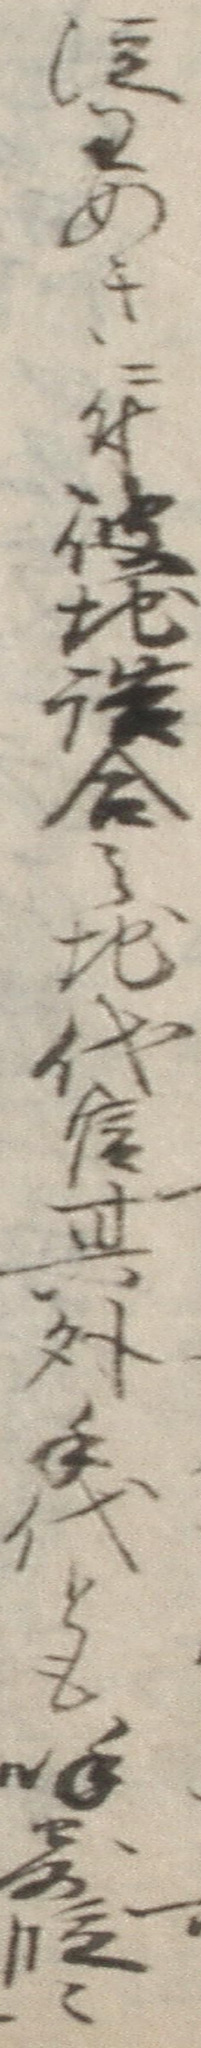泣わめきニ付彼地詰合之地代官其外手代とも呼寄段々
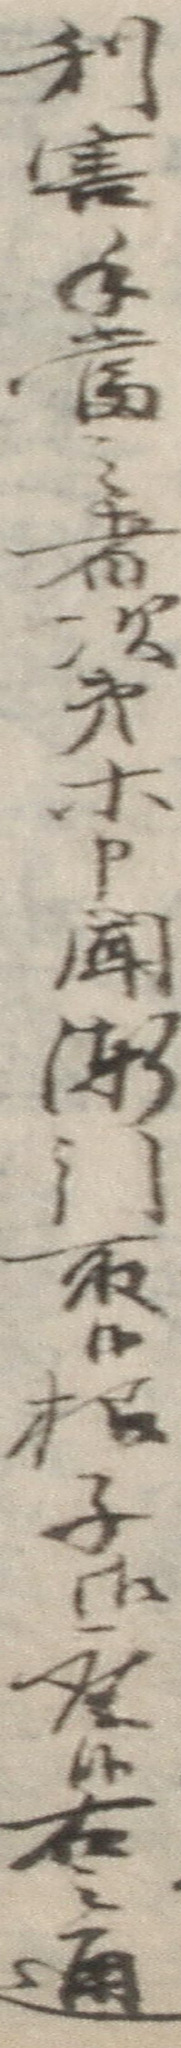利害手当之者次第等申聞漸引取候様子御座候右之通
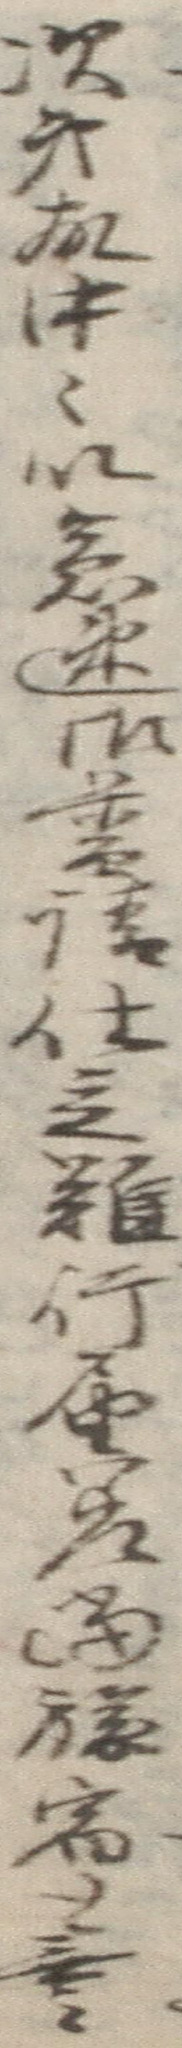次第故中々以急速御普請仕立難行届差当旅宿も無之
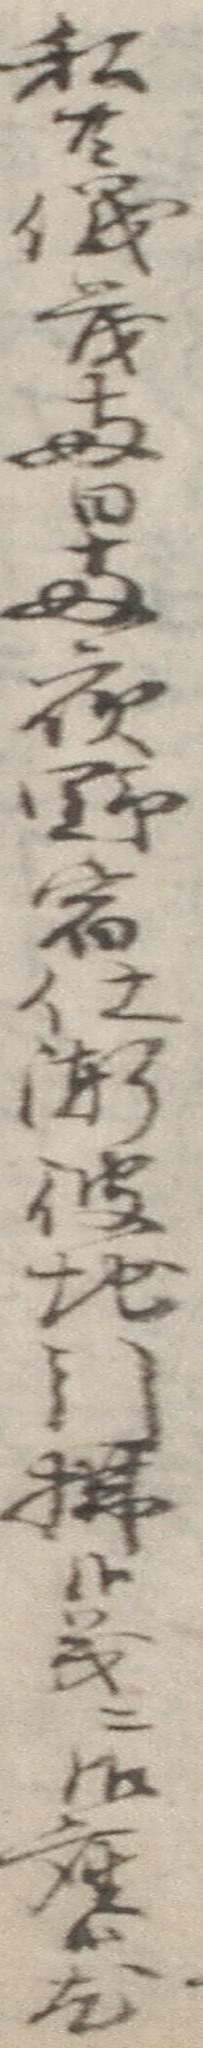私共儀も両日両夜野宿仕漸彼地引払候義ニ御座候尤
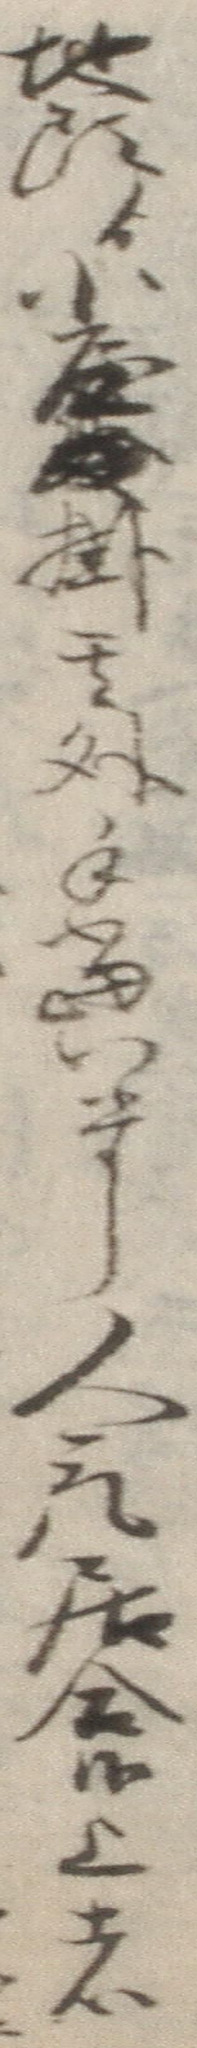地頭ゟ小屋掛其外手当いたす人足居合候上は
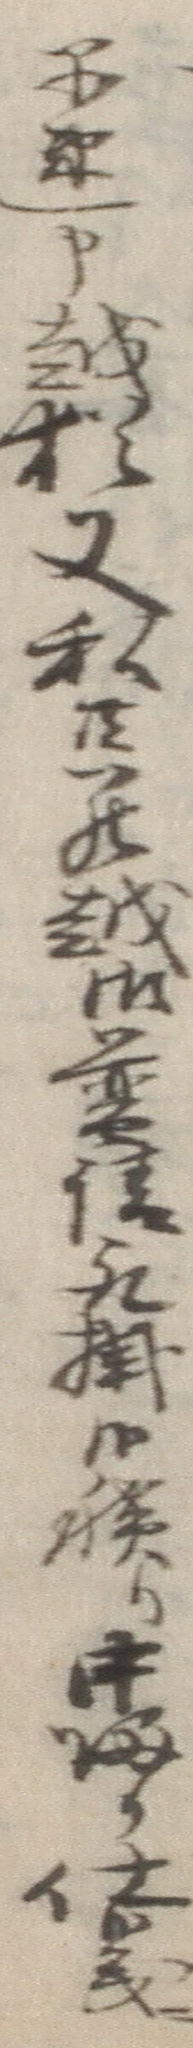早速申越猶又私共罷越御普請取掛候積り中帰り仕候義二
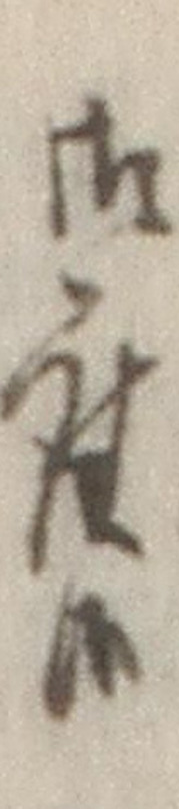御座候
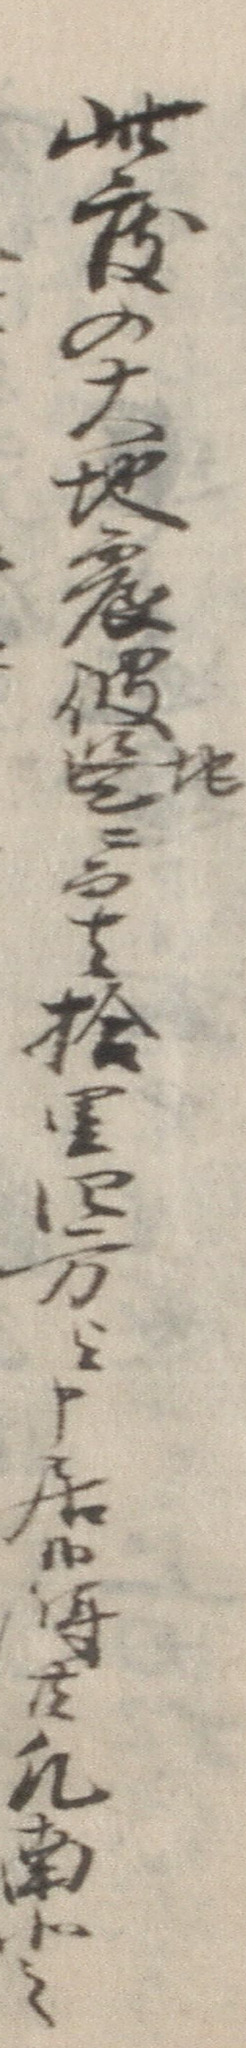此度の大地震彼地ニ而は拾里四方と申居候得共凡南北之
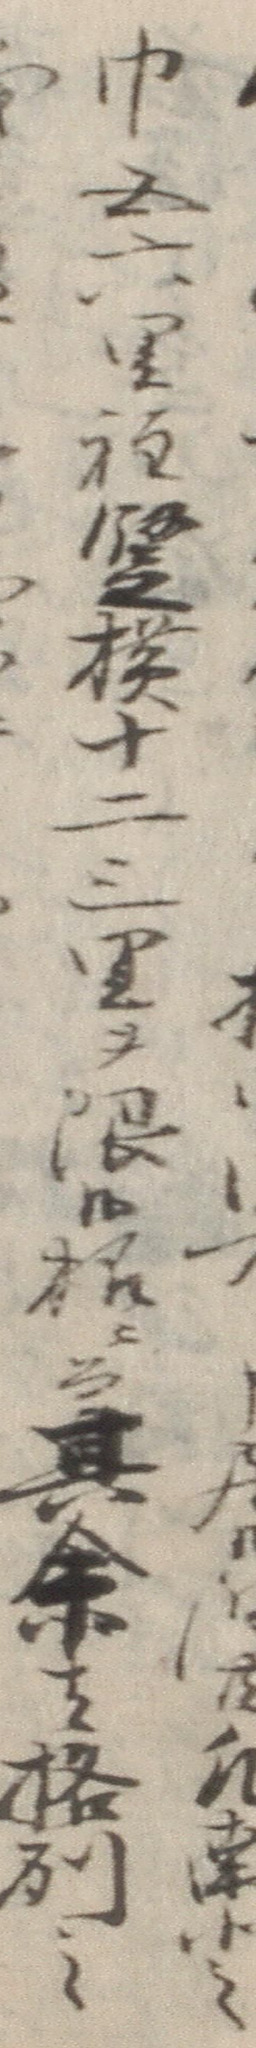巾五六里程竪横十二三里ヲ限候様ニ而其余は格別之
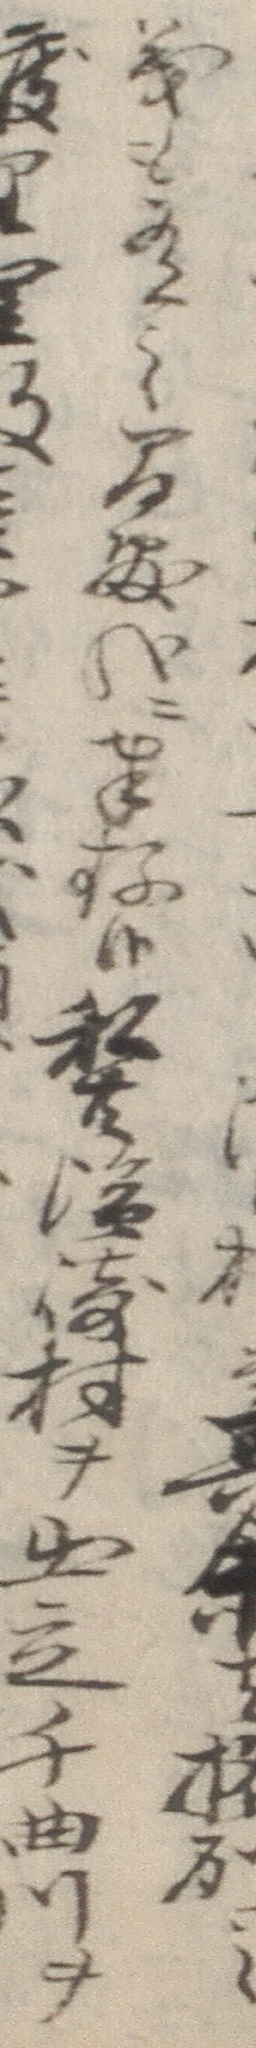義も有之間敷哉ニ奉存候私共塩崎村ヲ出立千曲川ヲ
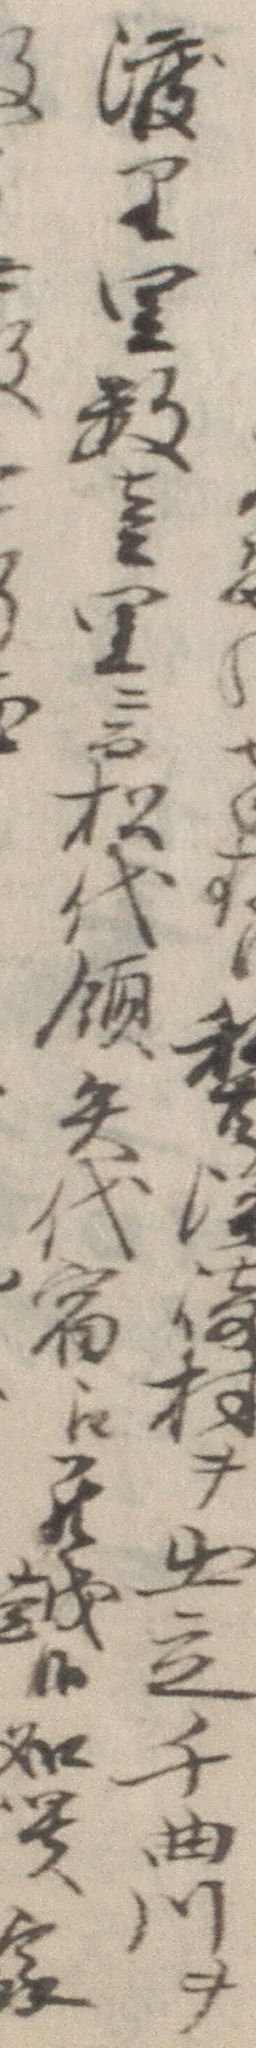渡り里数壱里ニ而松代領矢代宿え罷越候処潰家
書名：[善光寺地震に関する冊子]
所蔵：東京大学地震研究所図書室 Earthquake Research Institute Library, The University of Tokyo, JAPAN
